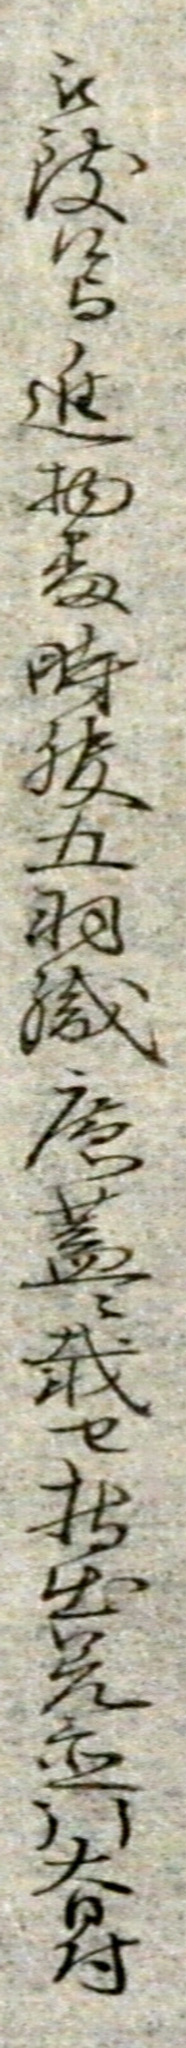被致候と進物番時服五羽織広蓋ニ載せ持出差置引大目付
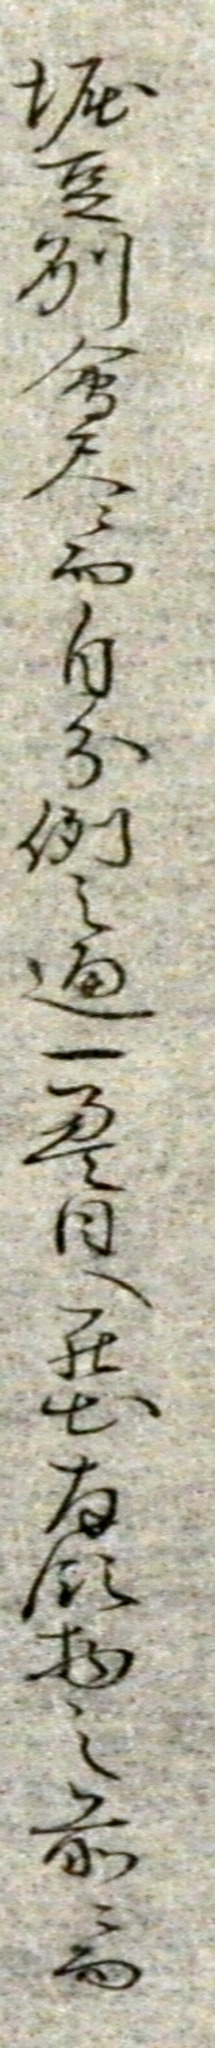堀豆州会尺ニ而自分例之通一畳目へ罷出拝領物之前ニ而
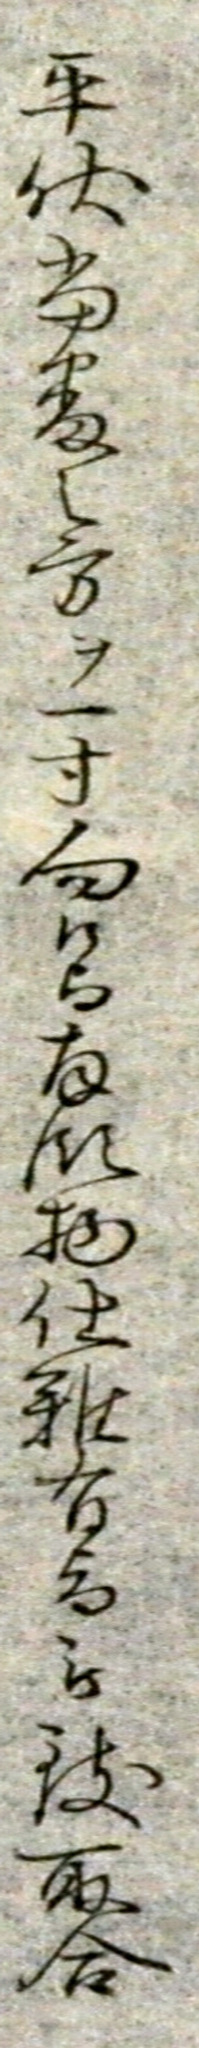平伏当番之方ヲ一寸向候と拝領物仕難有旨被致取合
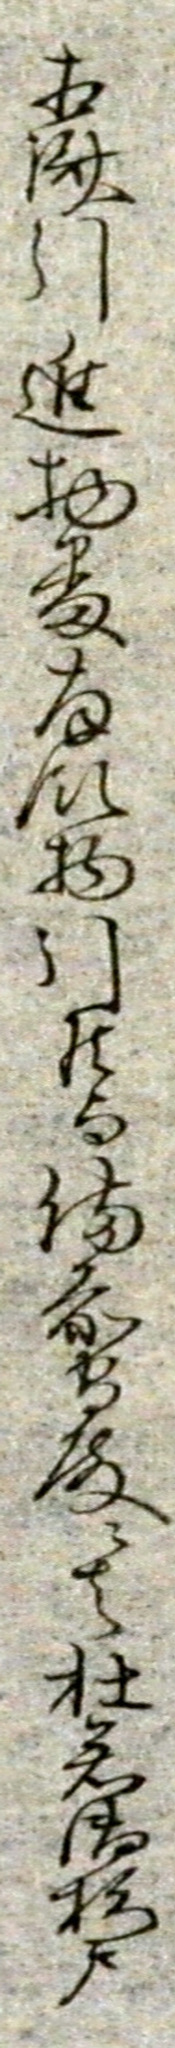相済引進物番拝領物引候と備前守殿ニ者杜若御杉戸
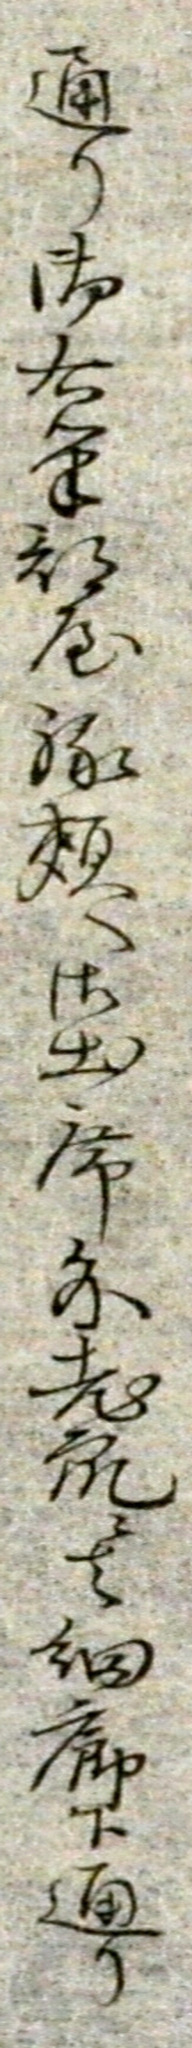通り御右筆部屋縁頬へ御出席外老衆ニ者細廊下通り
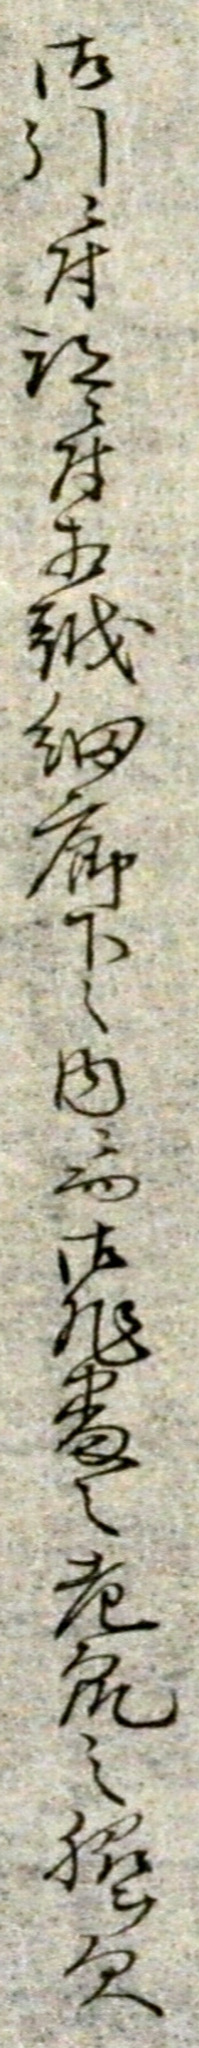御引ニ付跡ニ付相越細廊下之内ニ而御非番之老衆之脇ヲ欠
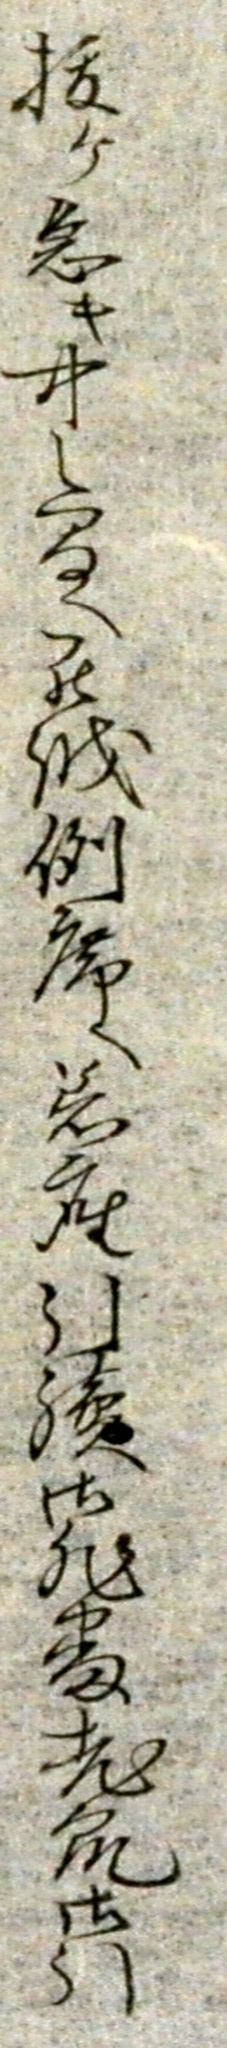抜ケ急キ中之間へ罷越例席へ着座引続御非番老衆御引
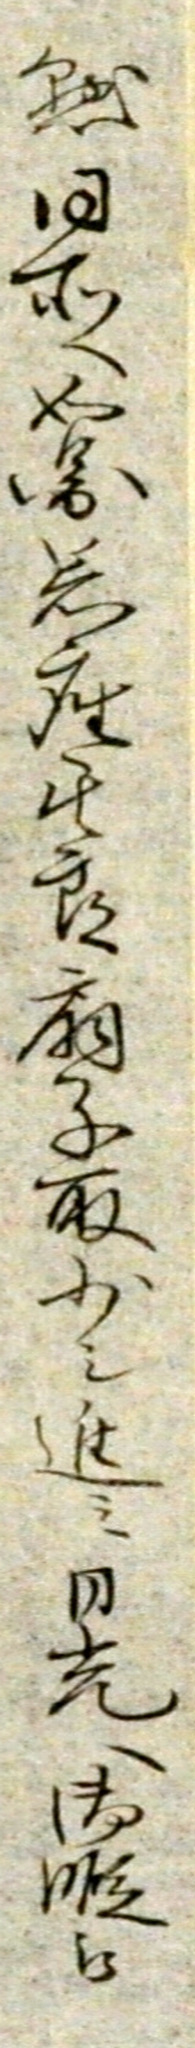懸同所へ如図着座其節扇子取少シ進ミ日光へ御暇被
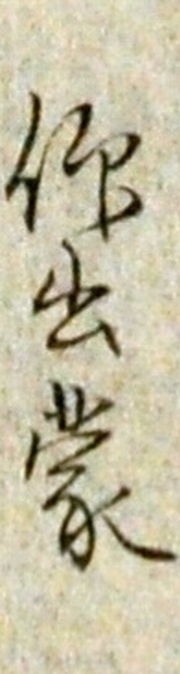仰出蒙
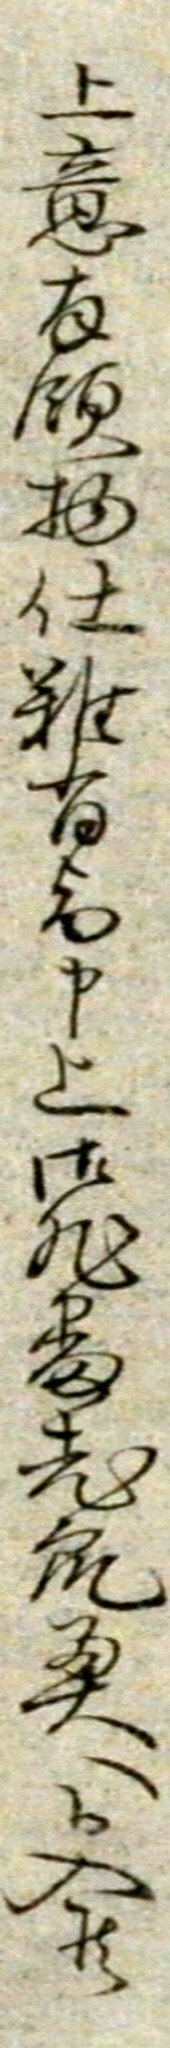上意拝領物仕難有旨申上御非番老衆奥へ被入候
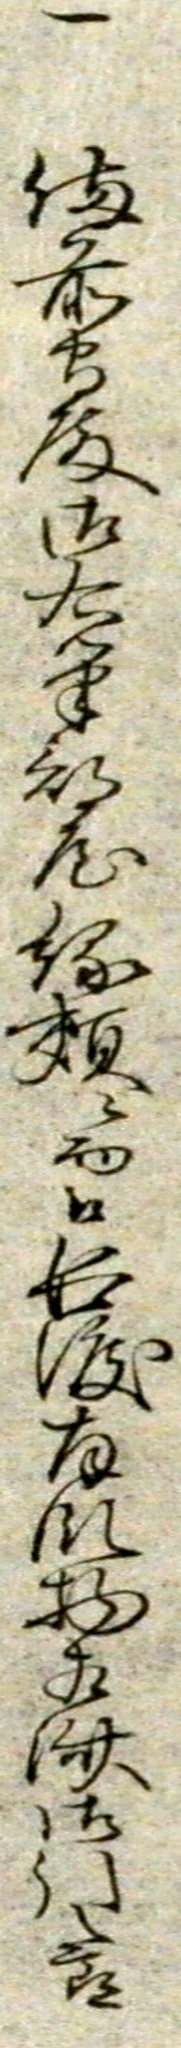一備前守殿御右筆部屋縁頬ニ而被仰渡拝領物相済御引之節
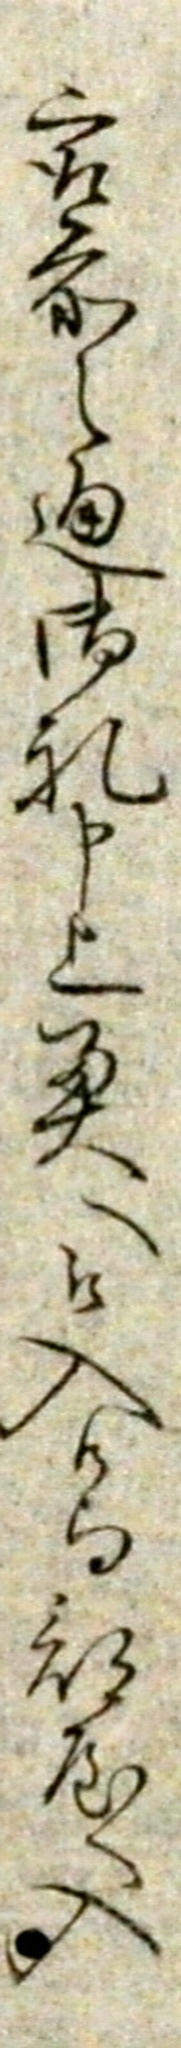最前之通御礼申上奥へ被入候と部屋へ入
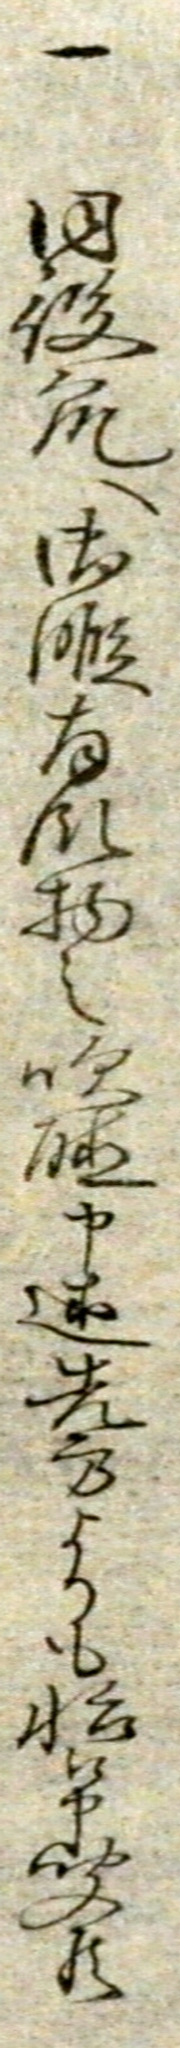一同役衆へ御暇拝領物之吹聴申述先方よりも怡被申聞候
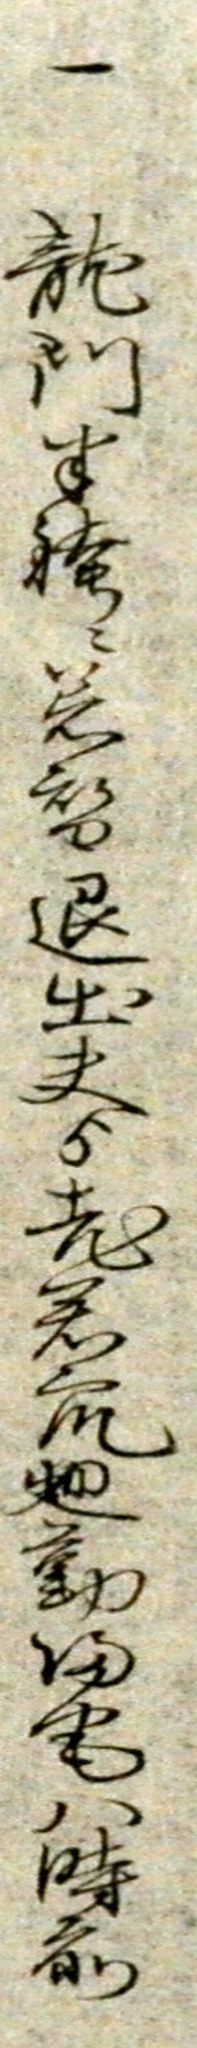一龍門半袴ニ着替退出夫ゟ老若衆廻勤帰宅八時前
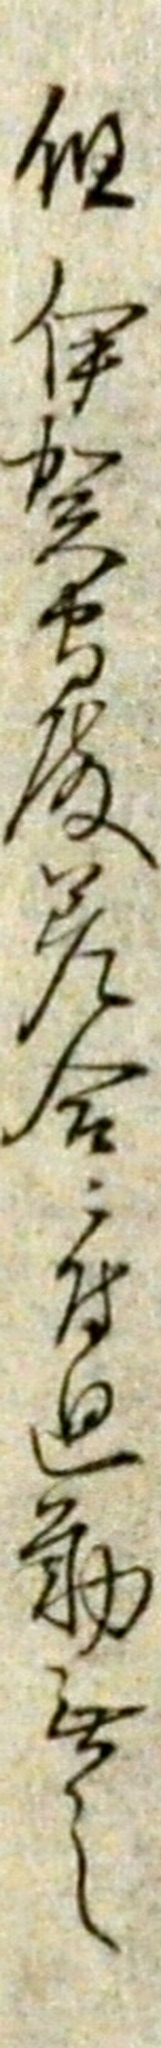但伊賀守殿差合ニ付廻勤無之
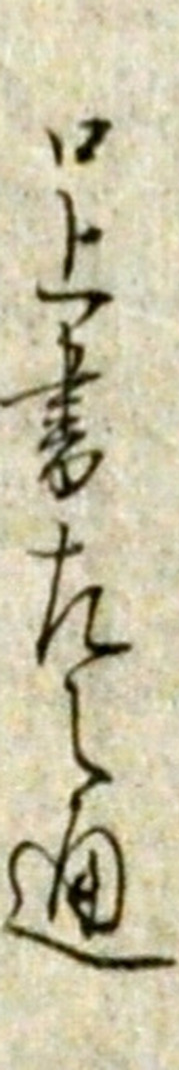口上書左之通
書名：日光御名代相勤候節ノ留
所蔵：伊那市立高遠町図書館・合同会社AMANE
